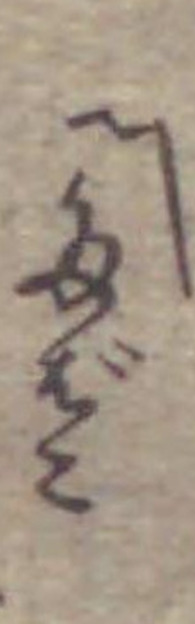〽たばこ
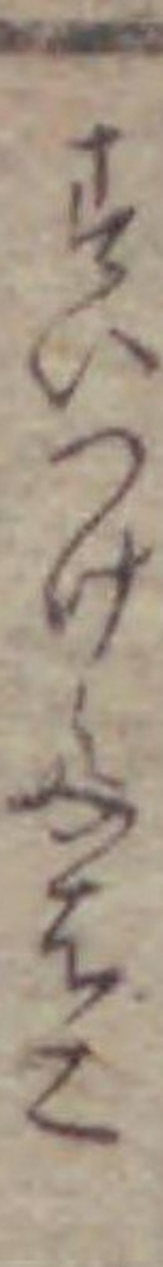すいつけたはこ
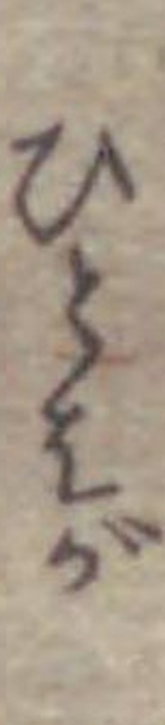ひとはが
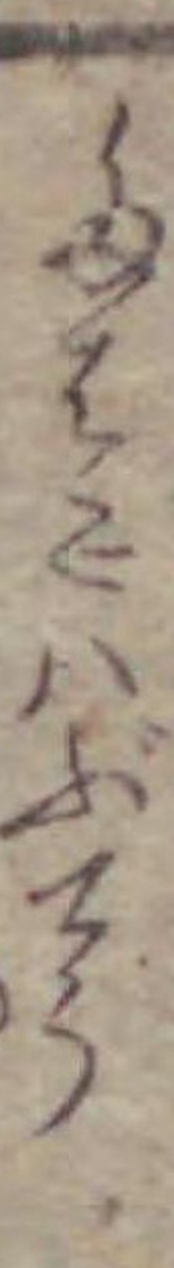たはこはぶてう
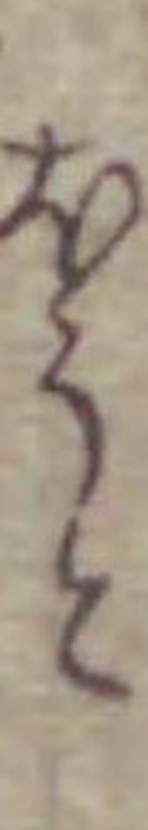ほうと
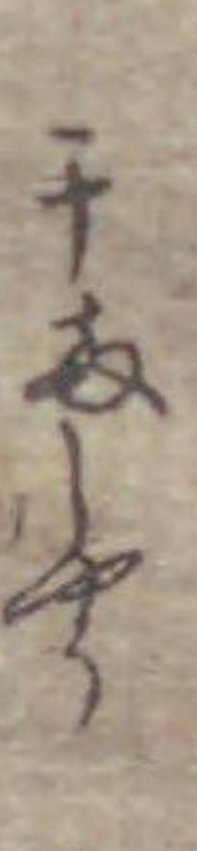千両しやう
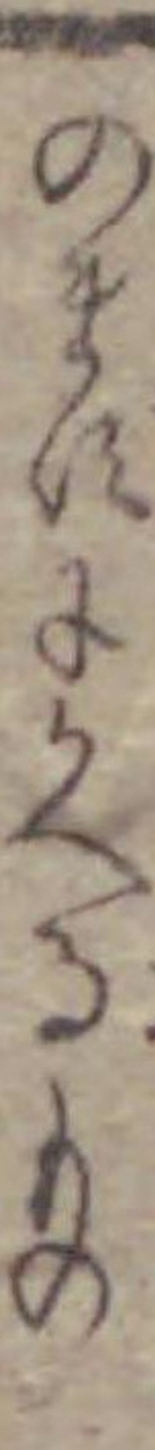のまずにかへるもの
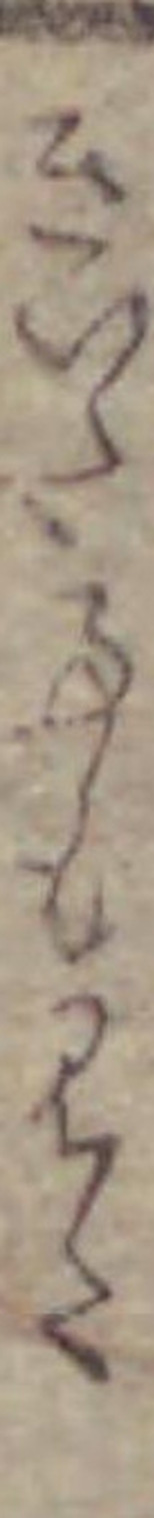きいた事も見た
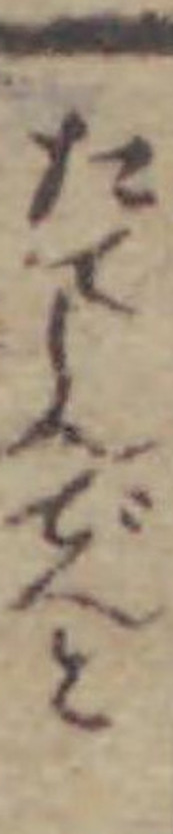たてしんでんと
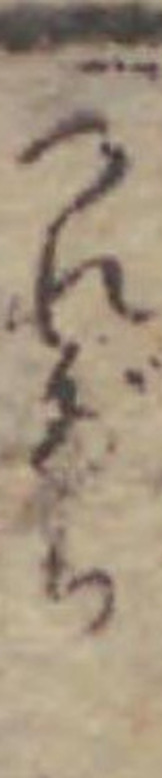つれだち
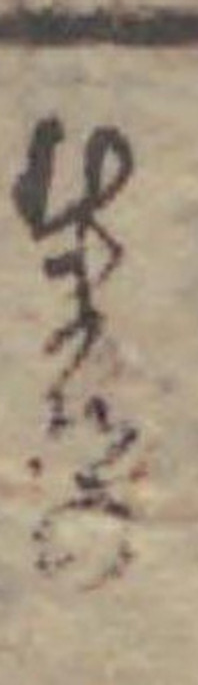むま屋の
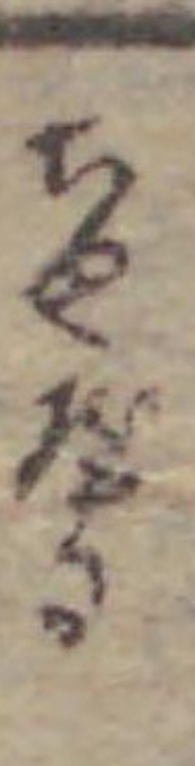ちや屋に
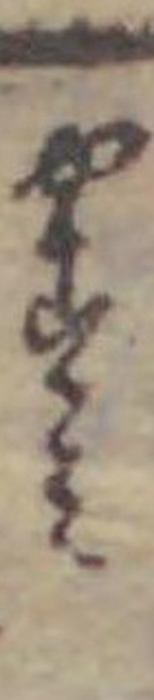やすみ
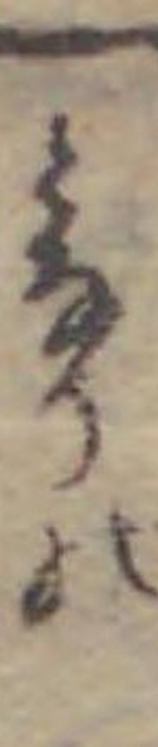となりの
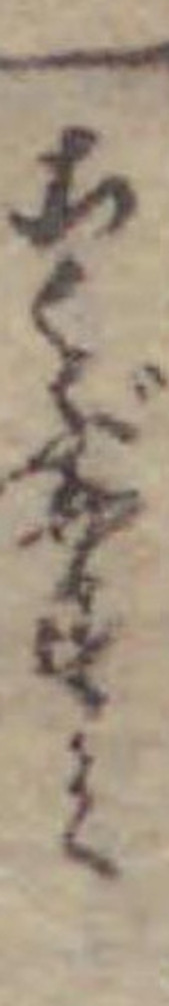こくぶやすみ
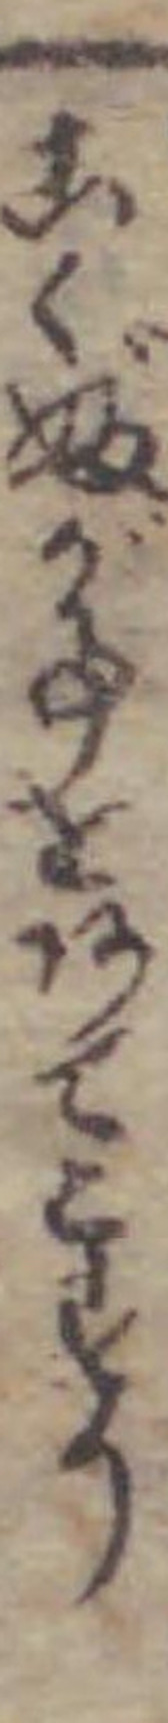こくぶが事をあてとすり
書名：談芭菰誉詞 : 3巻
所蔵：国立国会図書館 National Diet Library, JAPAN
